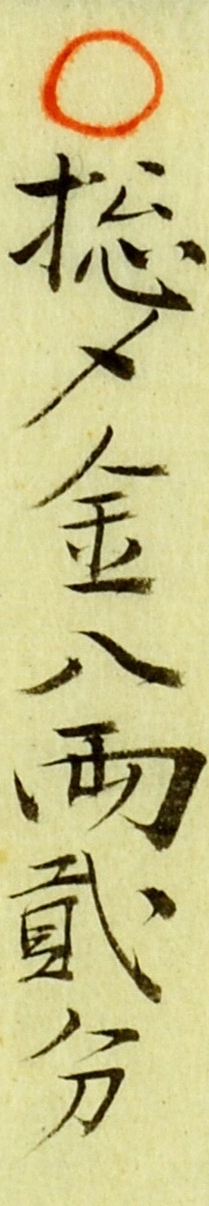〇総〆金八両弐分
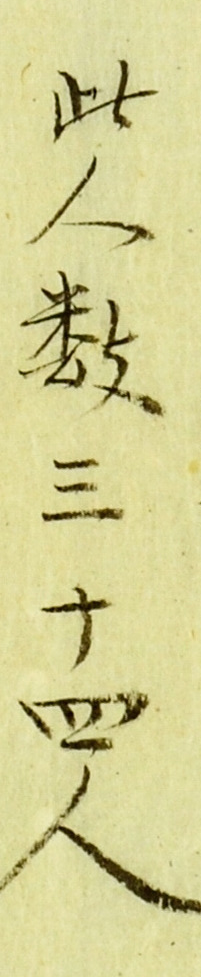此人数三十四人
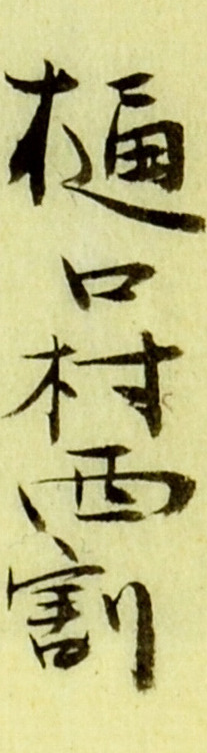樋口村西割
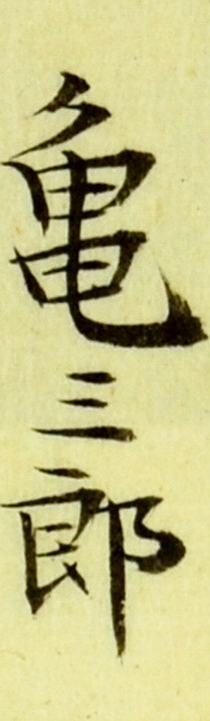亀三郎
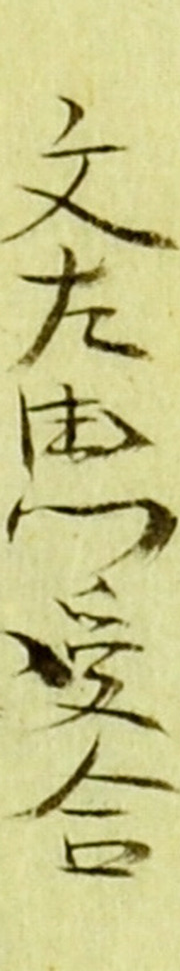文左衛門受合
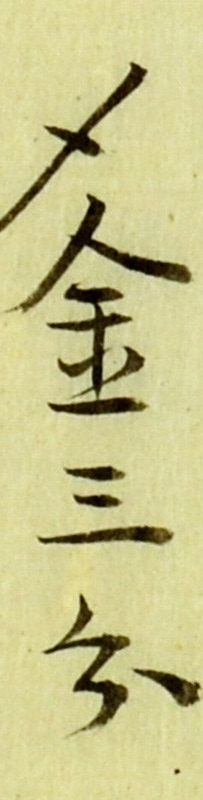〆金三分
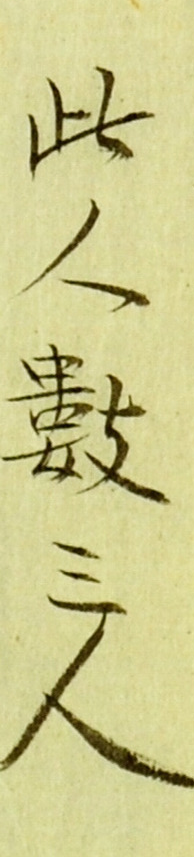此人数三人
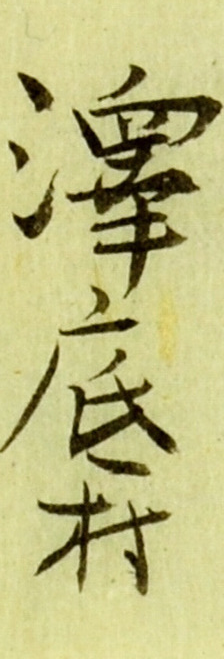沢底村

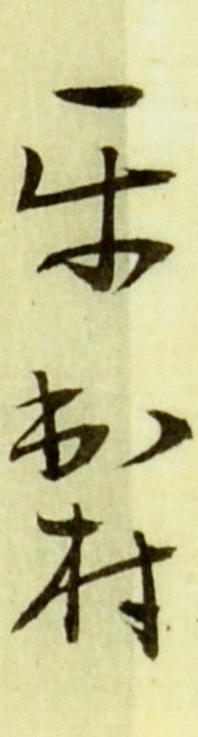平出村
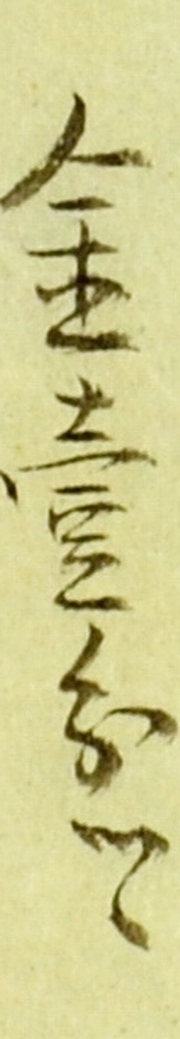金壱分亀治
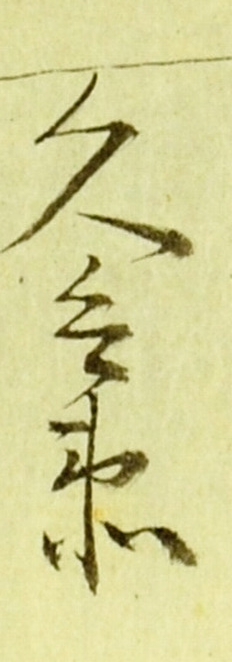久兵衛
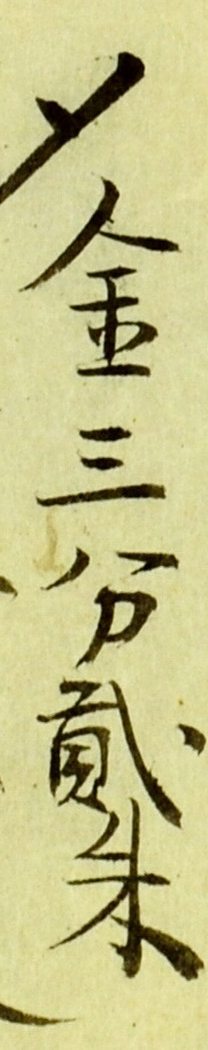〆金三分弐朱
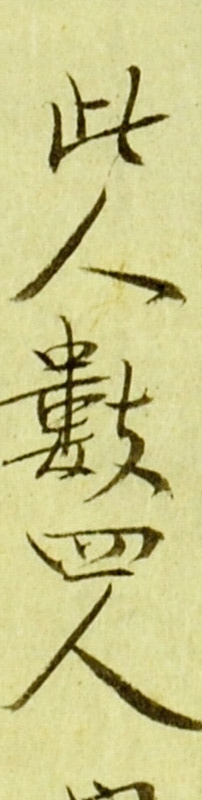此人数三人
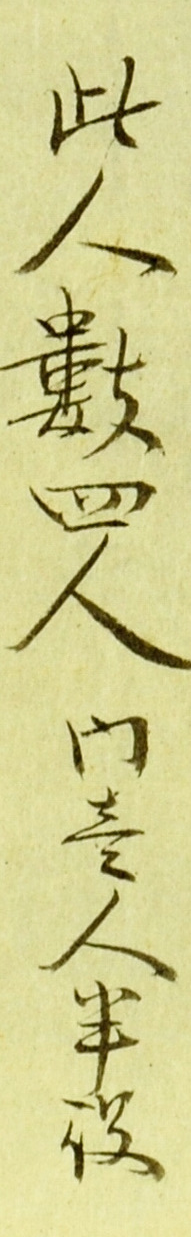此人数四人内壱人半役
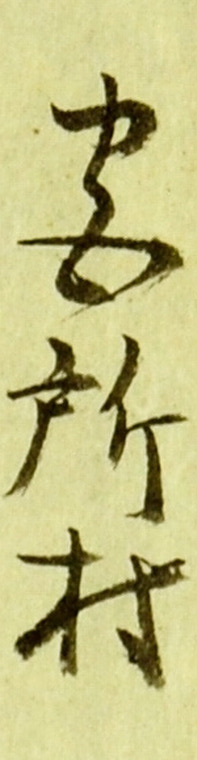宮所村
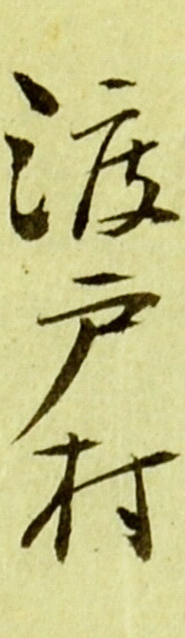渡戸村
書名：上伊那郷諸運上取調帳
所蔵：伊那市立高遠町図書館・合同会社AMANE
